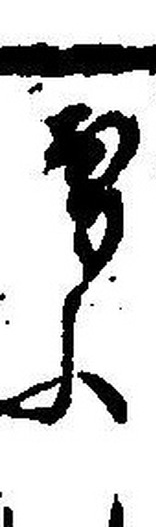おもふ

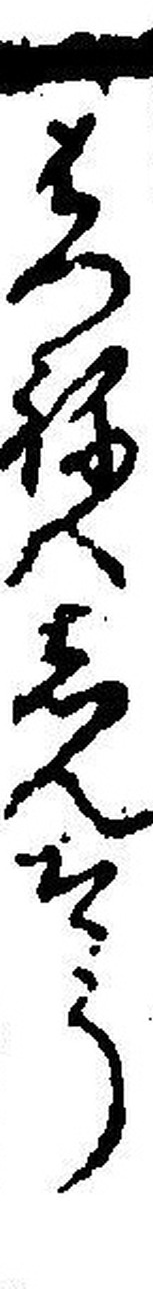はつねはしんそう
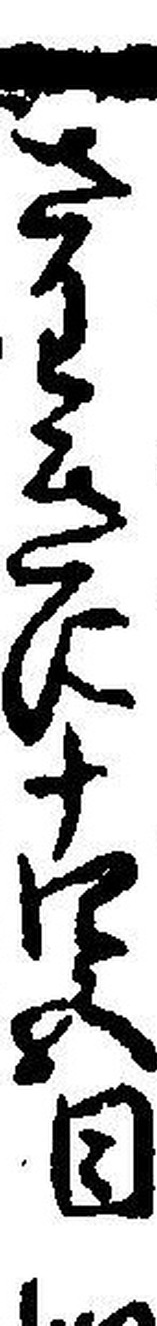さわきに十四五日
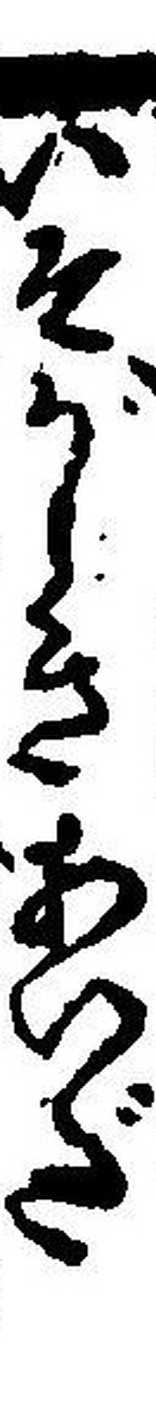いそがしきあいだ
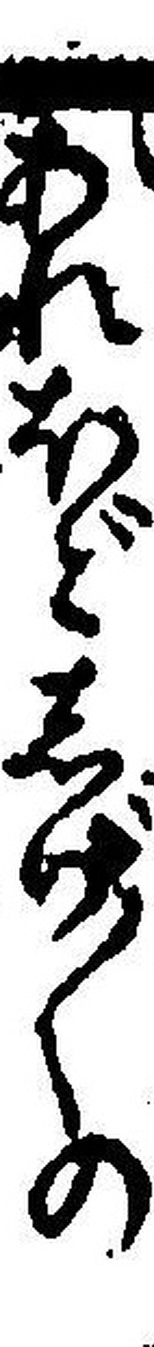あれほどしげ〳〵の
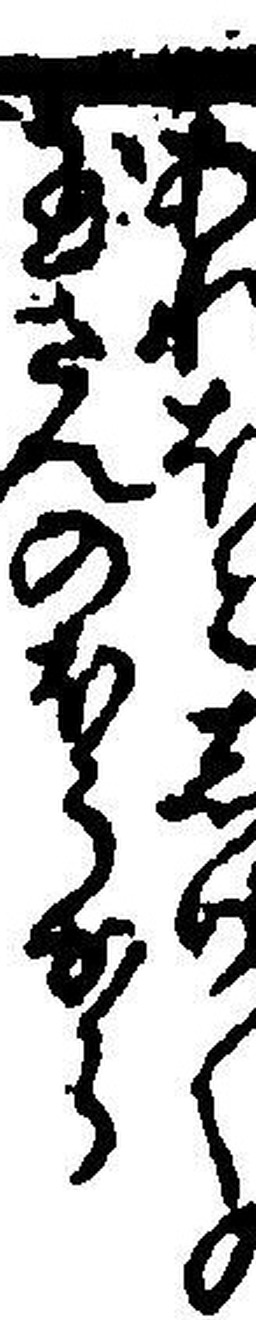玉さんのほうから
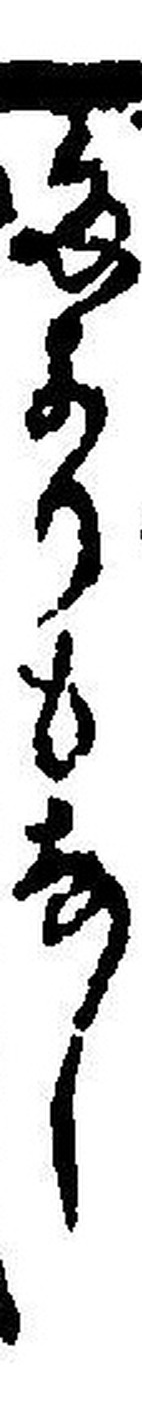たよりもなし
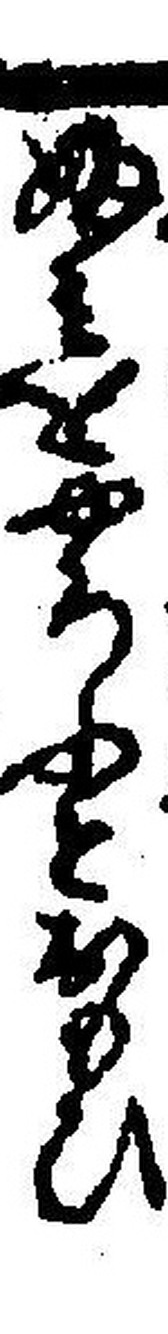ふみをやろふとおもひ
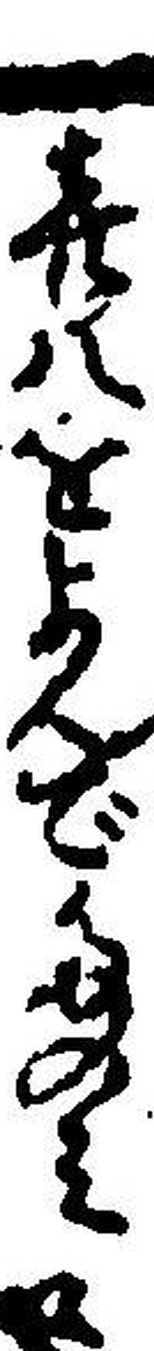喜八をよんでたのみ
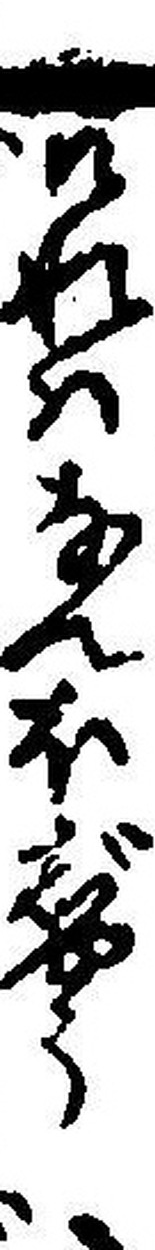けれはなんほじやう
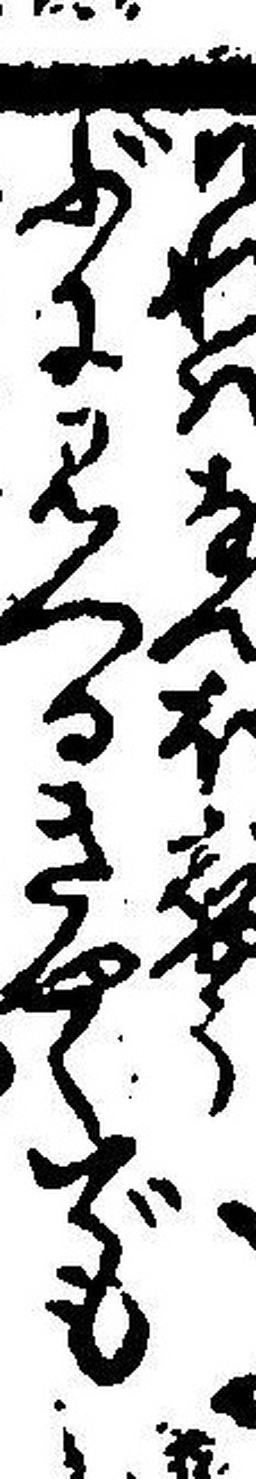ぶに見へるきやくでも
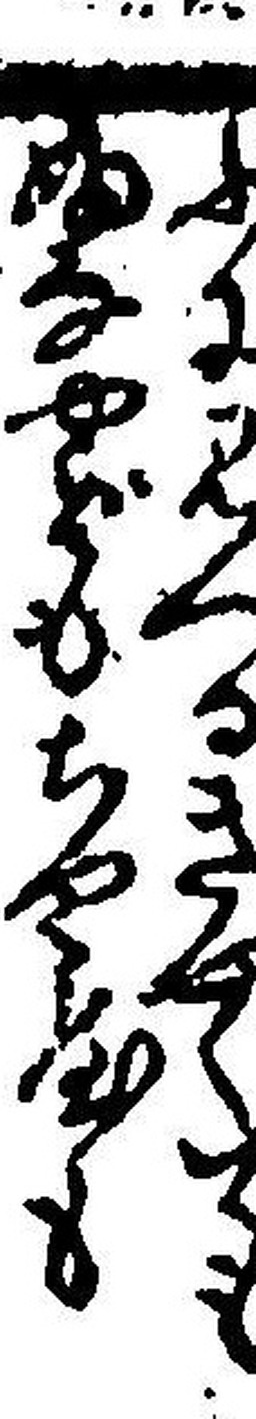ふなやどもちや屋も
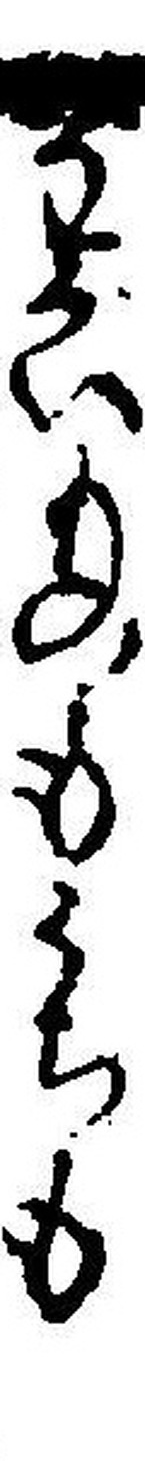わかいものもうちも
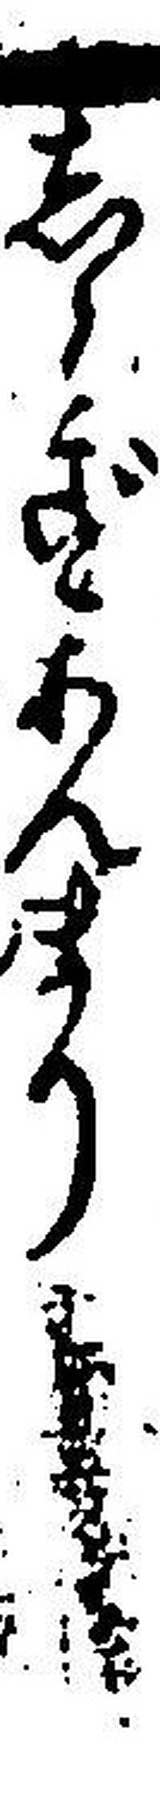しらずあんまり
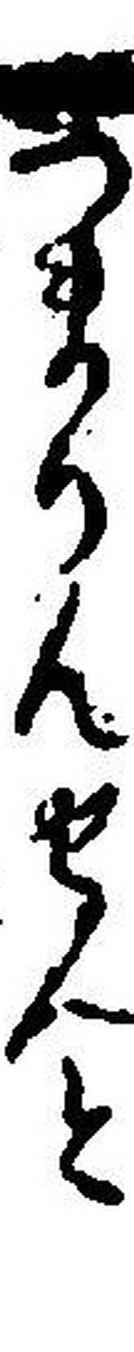つまりんせんと
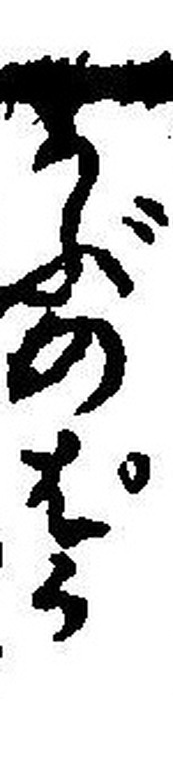かぶのぱか
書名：間違狐之女郎買 / 市場通笑作
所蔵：東京大学総合図書館 General Library in the University of Tokyo, JAPAN
